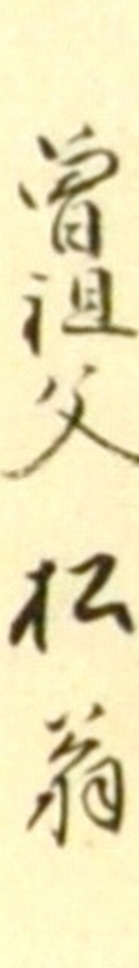曽祖父松翁
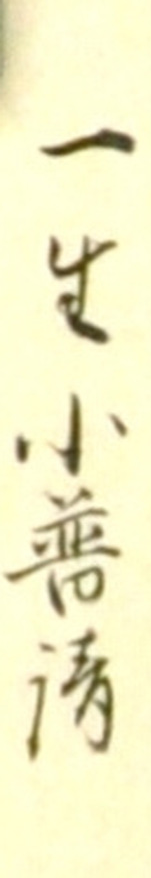一生小普請
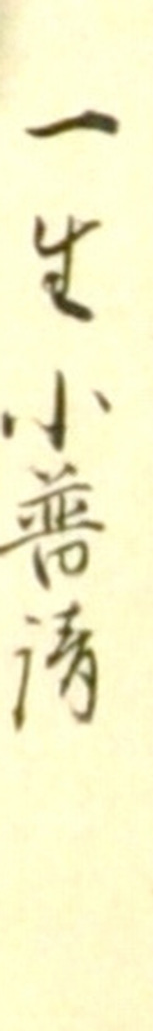一生小普請

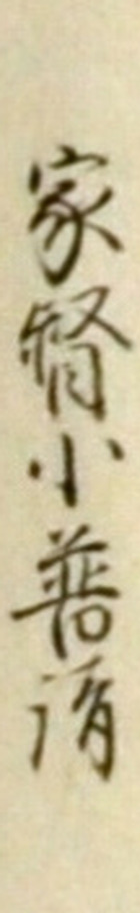家督小普請
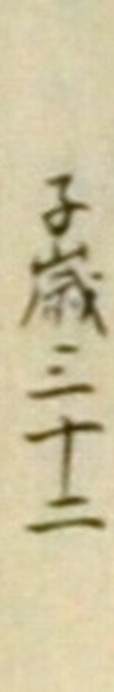子歳三十二
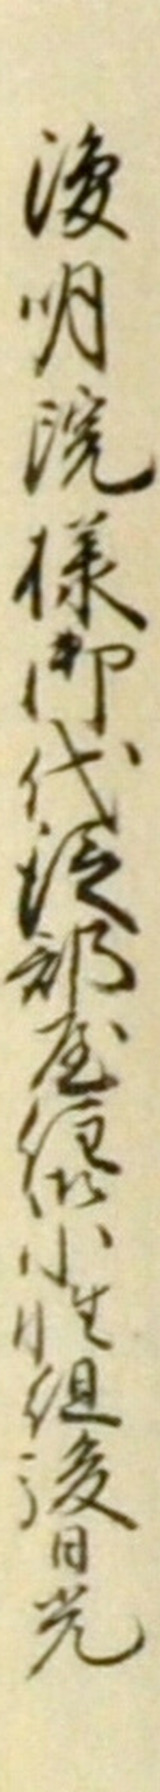浚明院様御代従部屋住御小姓組後日光
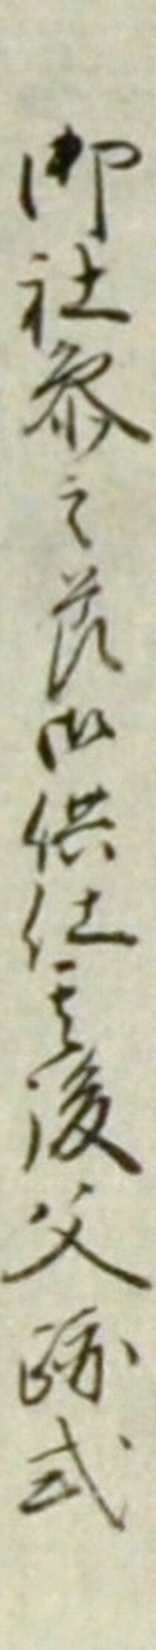御社参之節御供仕其後父跡式
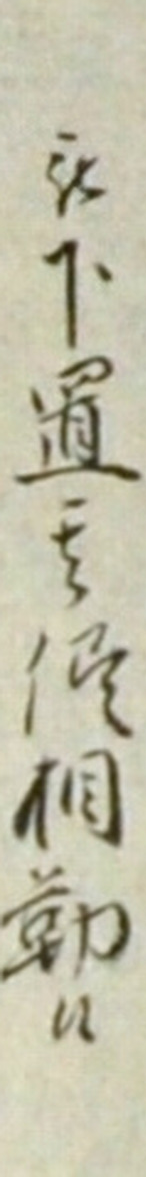被下置其侭相勤候
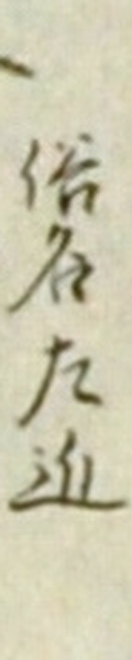俗名左近
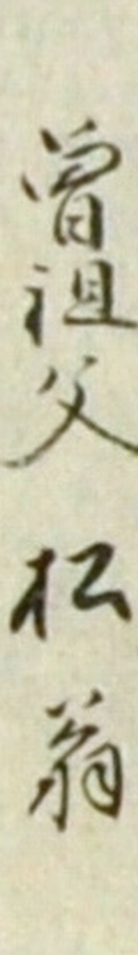曽祖父松翁
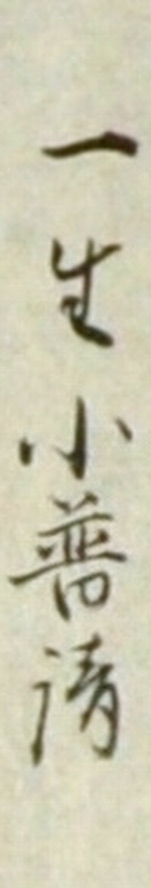一生小普請
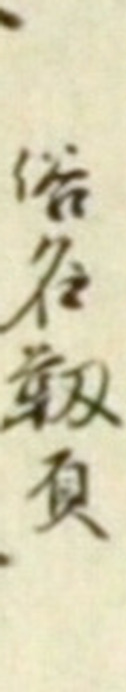俗名靱負
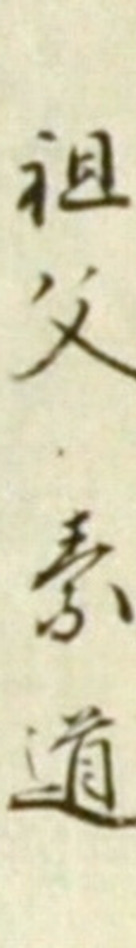祖父素道
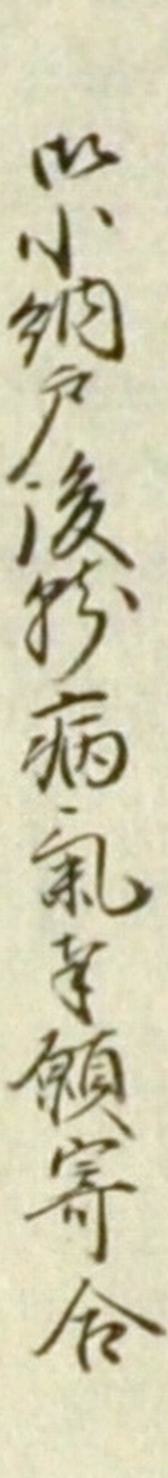御小納戸後就病気願寄合
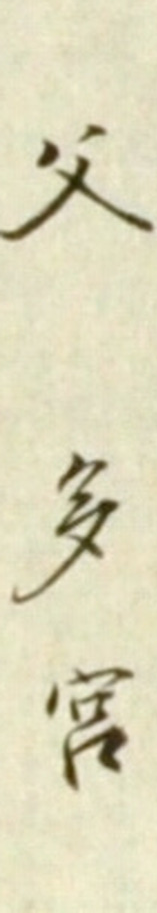父多宮
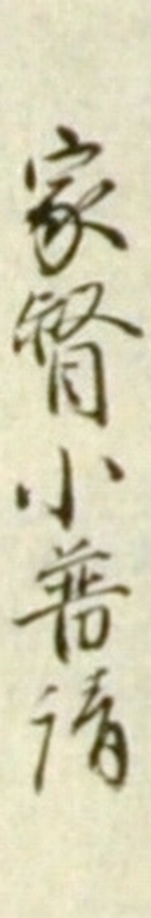家督小普請
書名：若年寄御役中御調書付
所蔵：伊那市立高遠町図書館・合同会社AMANE
